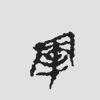軍
